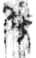張
